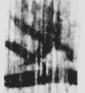之
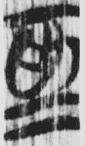爲
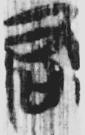君
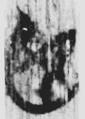臣
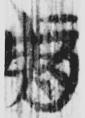𨟻（將）
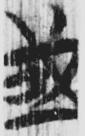或
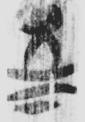至
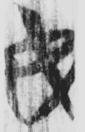𡚦（焉）
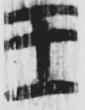王
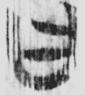曰
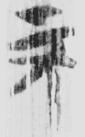不
